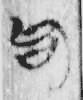句
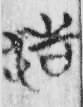浩
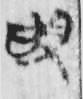受
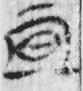○（期）
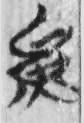○（爨）
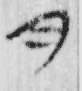月
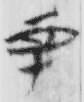辛
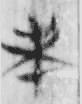未
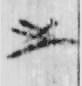之
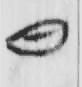日
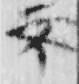不
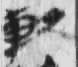○（範）
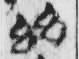○（兹）
